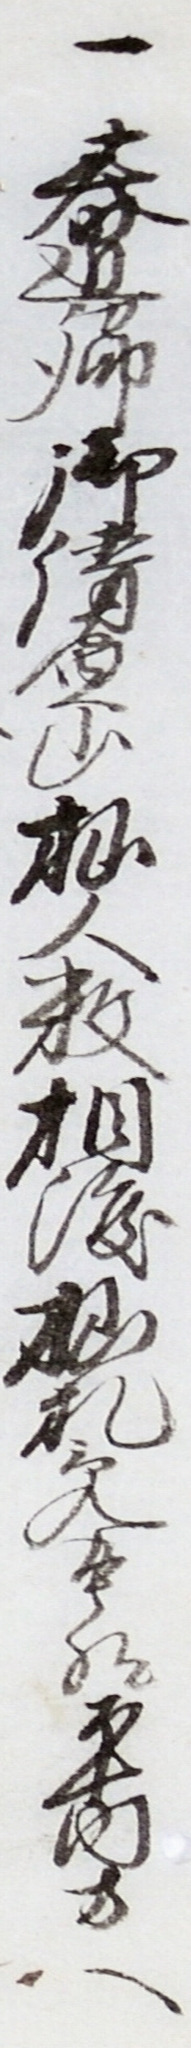一春近郷御請負山杣人数相渡杣札受届候様平内方へ
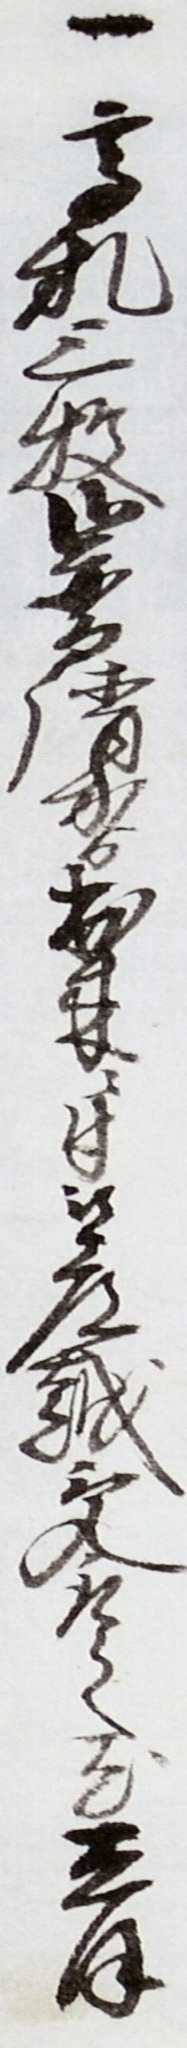一高札三枚御普請方より出来ニ付被差越受取候尤去月
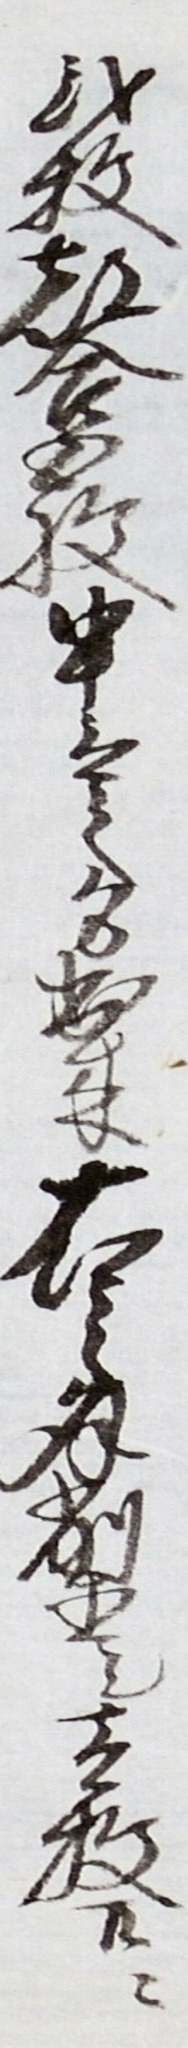弐枚都合五枚申上之方出来右之削直之壱枚共ニ
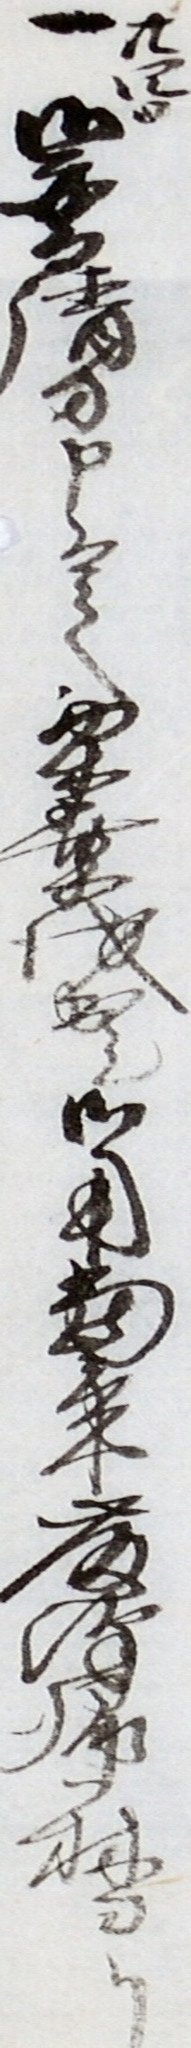一御普請方申上候葉伐出し御用当年藤沢帰林ヨリ
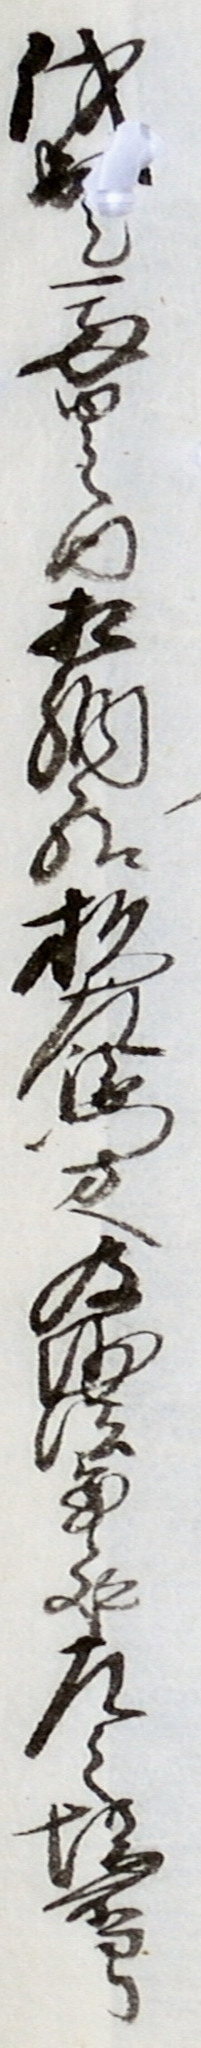伐出し一両申之内相納候様杉左衛門方へ及沙汰年処左之場替り
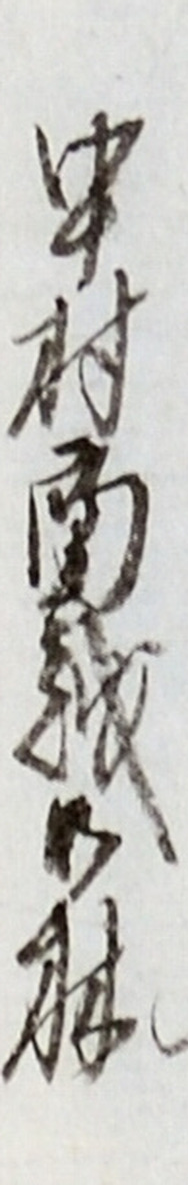中村南越御林
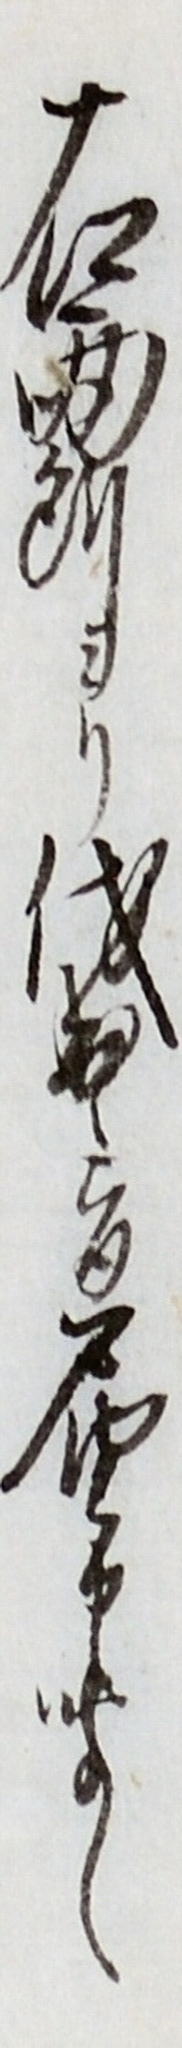右両所ヨリ伐出候旨届申聞候
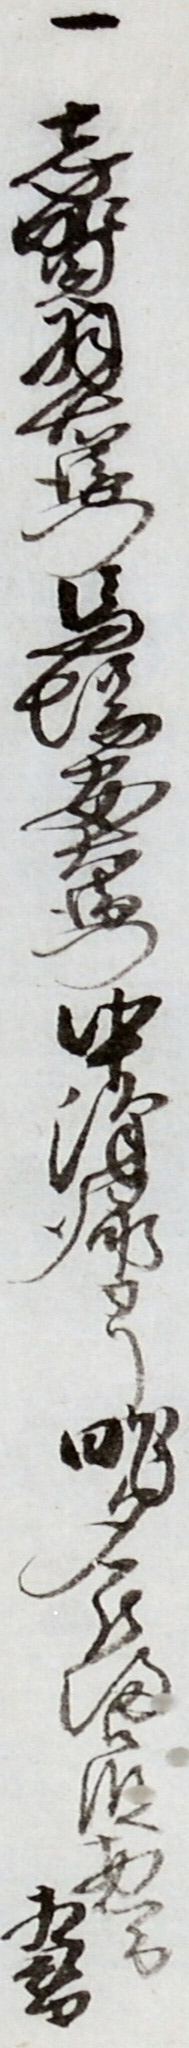一志野羽右衛門馬場安右衛門中沢郷ヨリ昨夕罷帰候段惣而
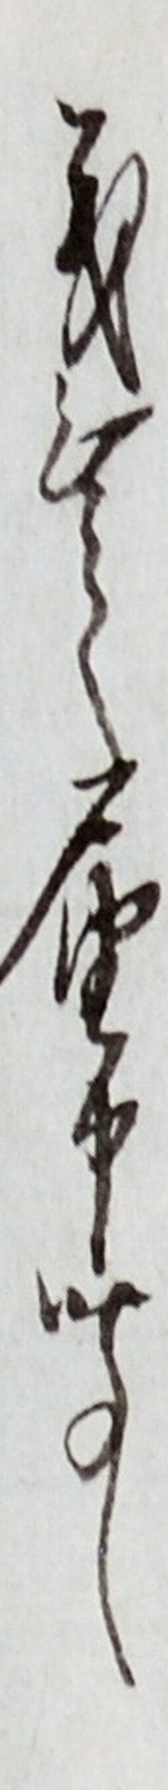義無之届申聞候
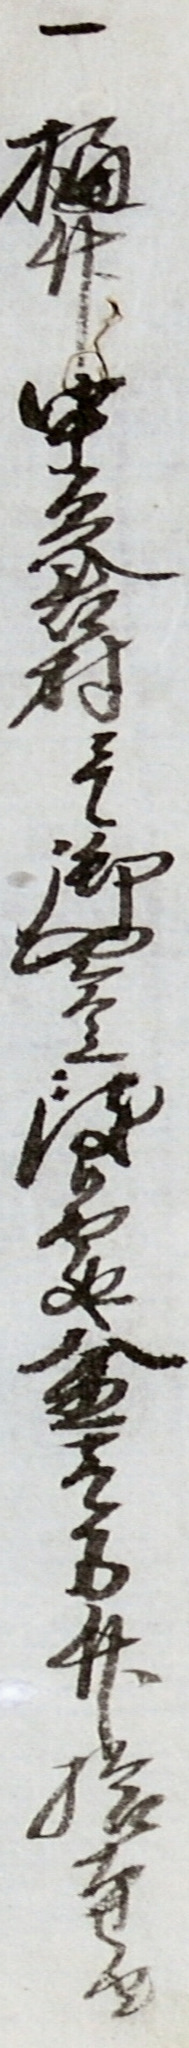一桶升中曽倉村ニて御買上致候処金壱万升拾壱匁由

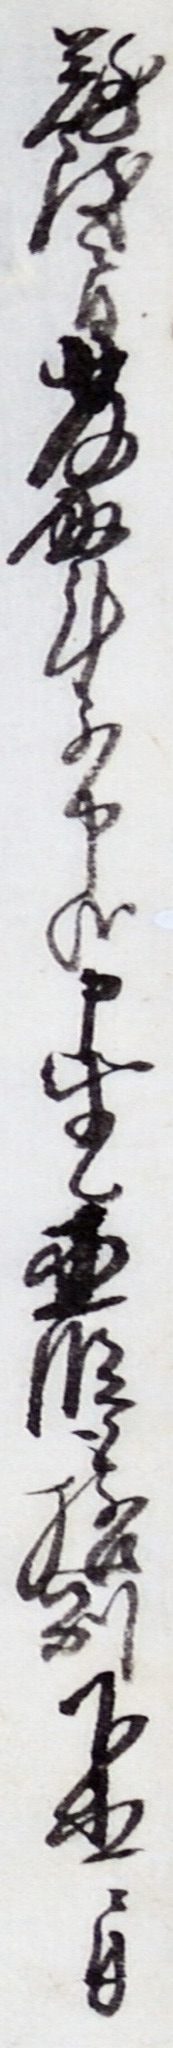難渋ニ付為取計可申哉申聞候直段も格別下直に付
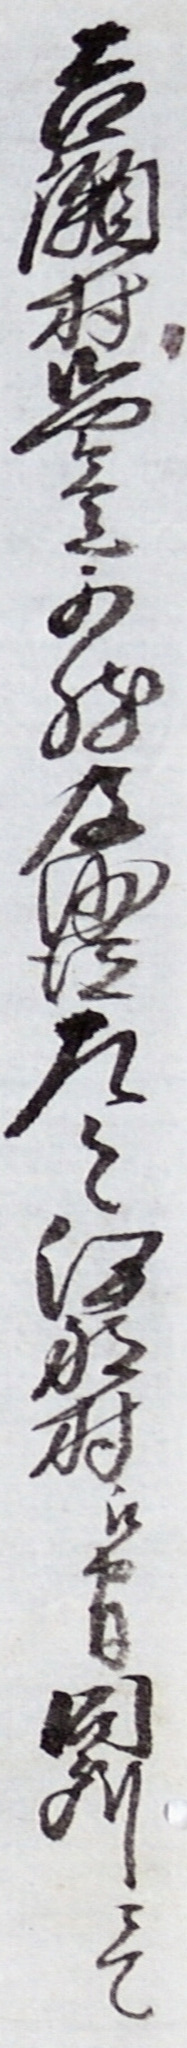吉瀬村御買上可然及沙汰左者伊那村江申付同断ニて
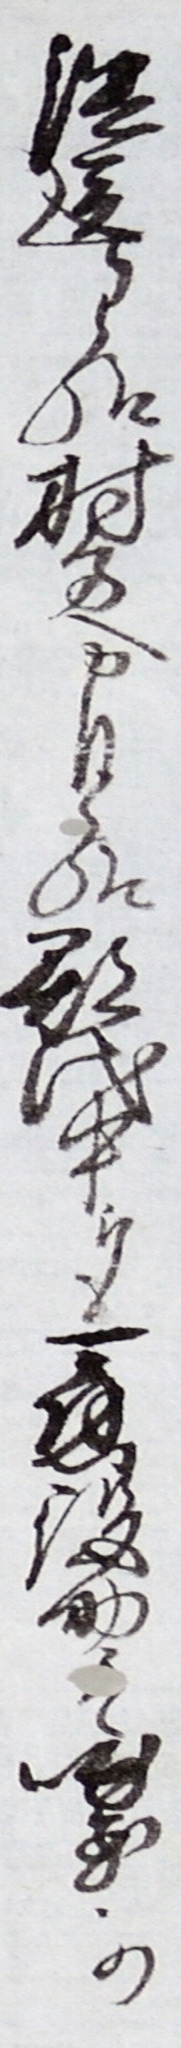継送り候様村方へ申付候様郡代中江も一応役助ニて呼出可
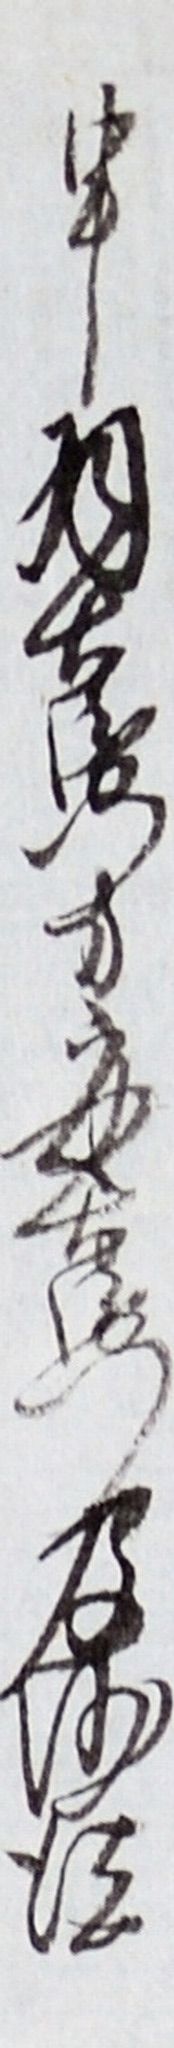申羽右衛門方安右衛門及沙汰
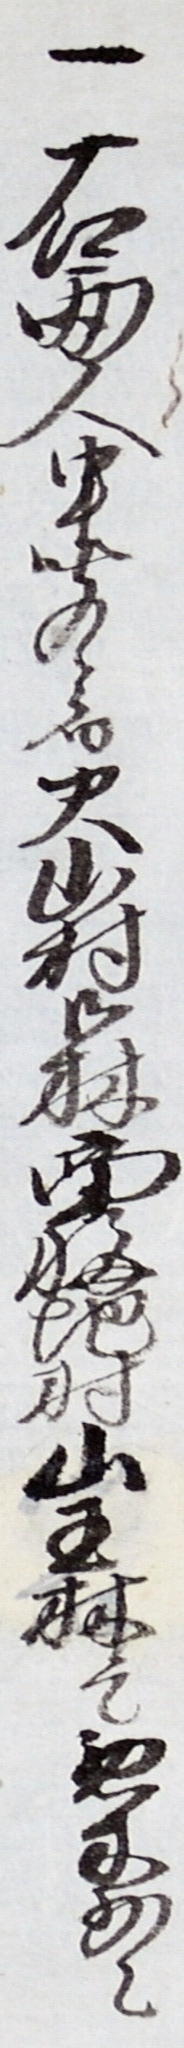一右両人申聞候而火山村御林西勝地村山王村ニて惣木少々
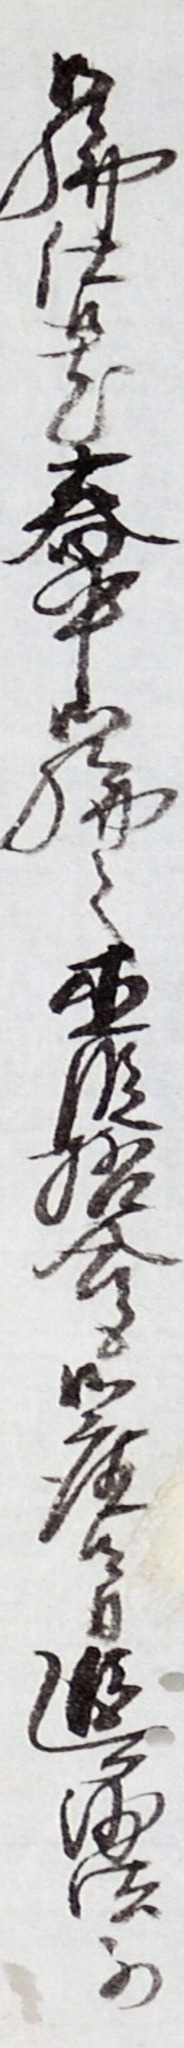御払仕候尤春中御払之直段格合も御座候に付追而沙汰可
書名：御山奉行御用控
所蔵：伊那市立高遠町図書館・合同会社AMANE
